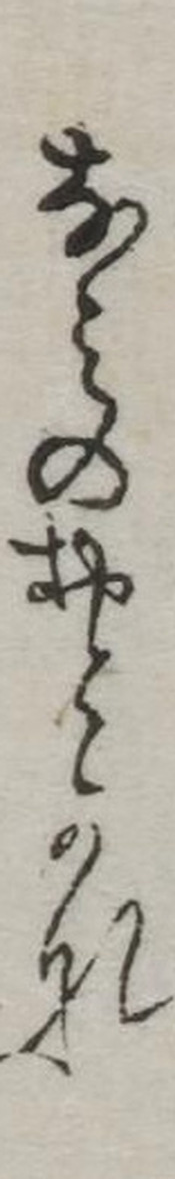なみのおとかな
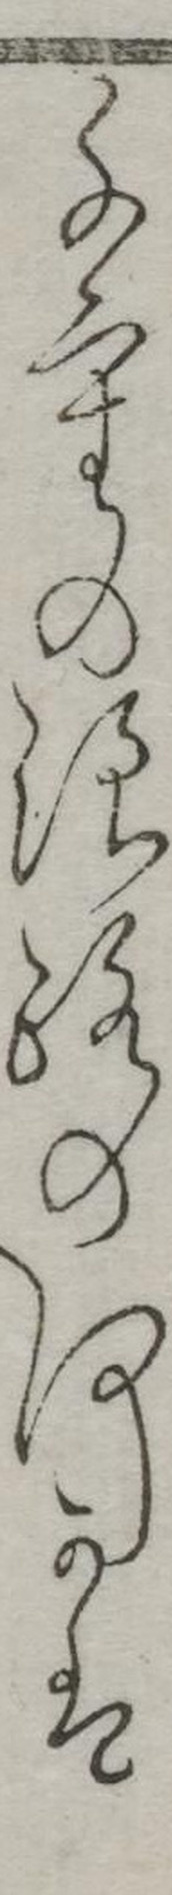千重の浪路の何かは
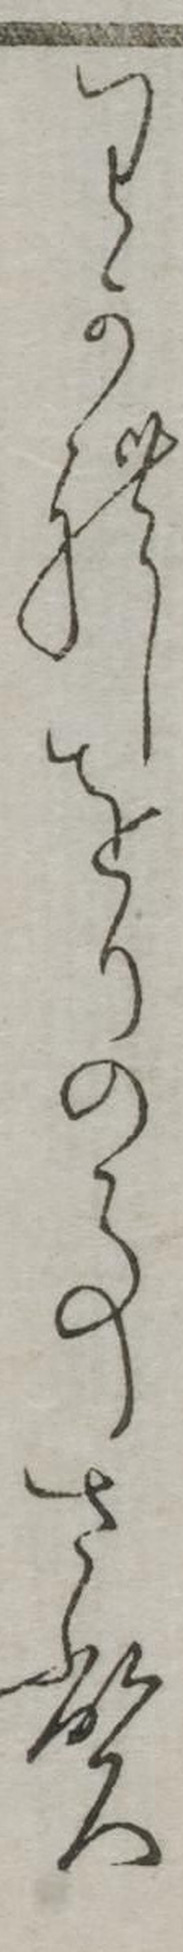わかれしをりの事さへ

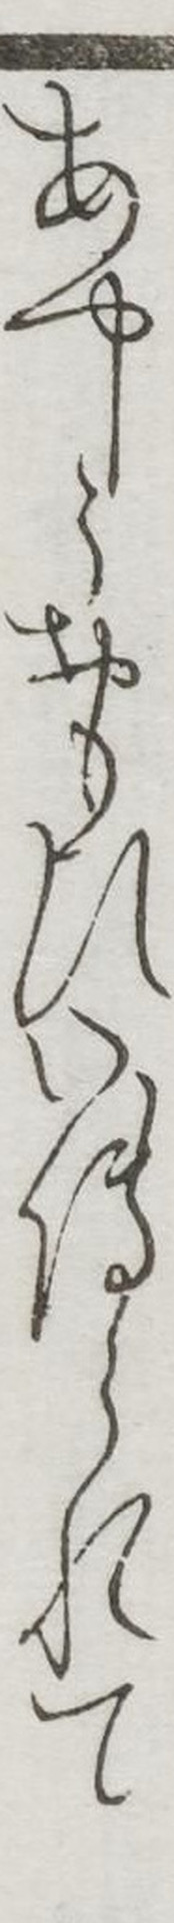あやしうおもひいてられて
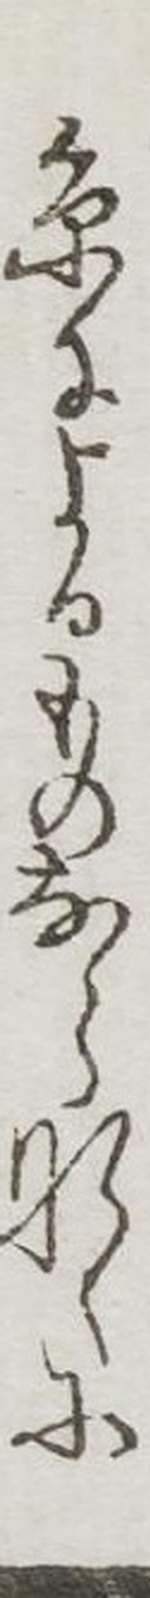糸によるものならなくに
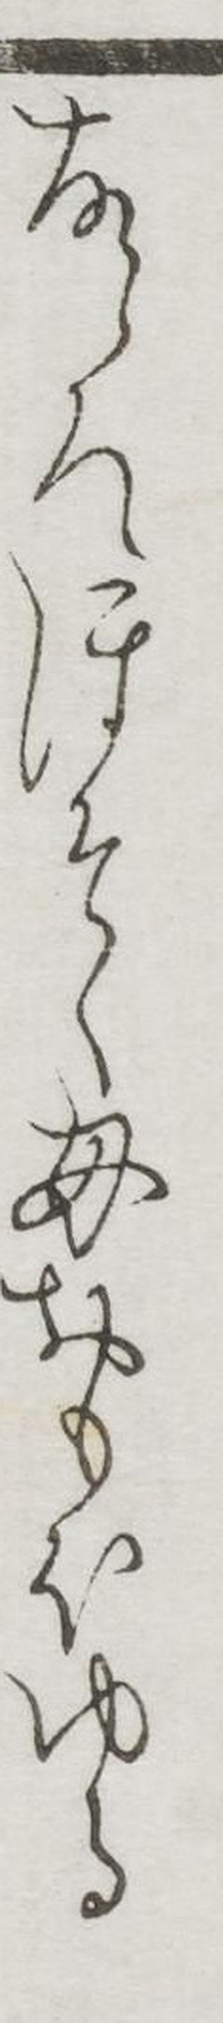こゝろほそくもおもほゆる
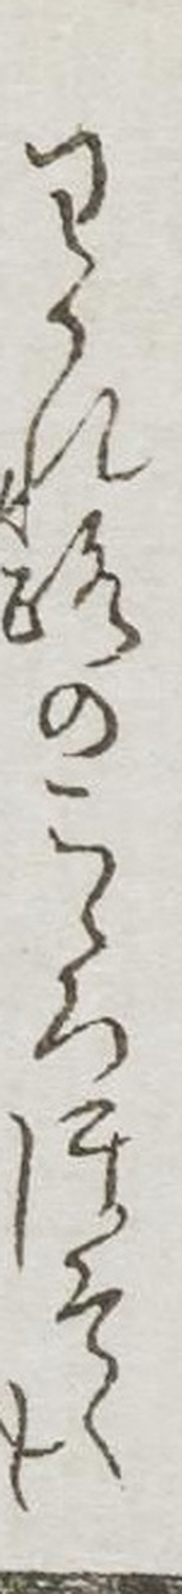わかれ路のこゝろほそくも
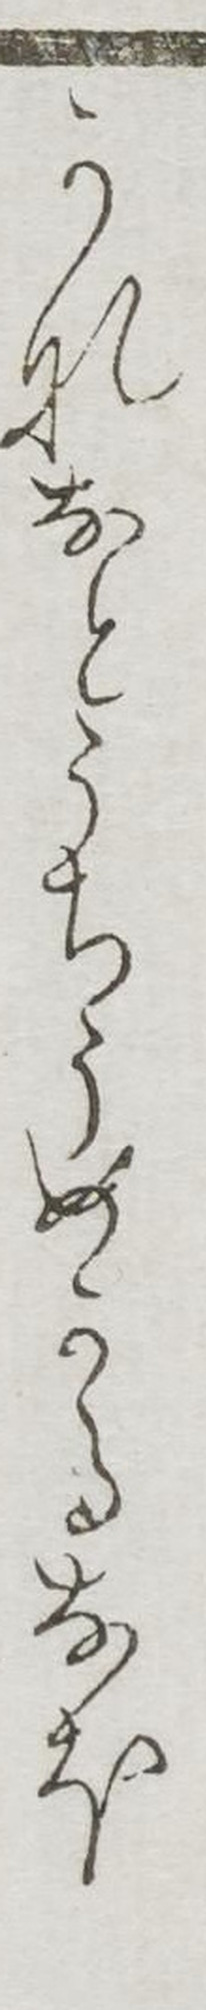かななとうちうめかるなほ浮嶌
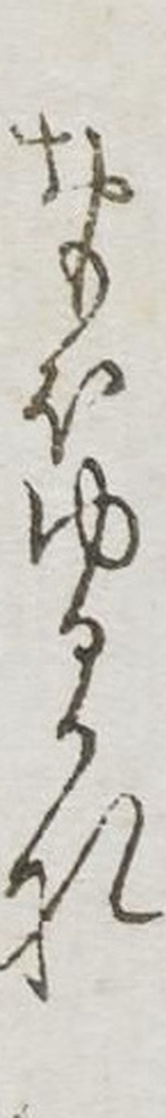おもほゆるかな
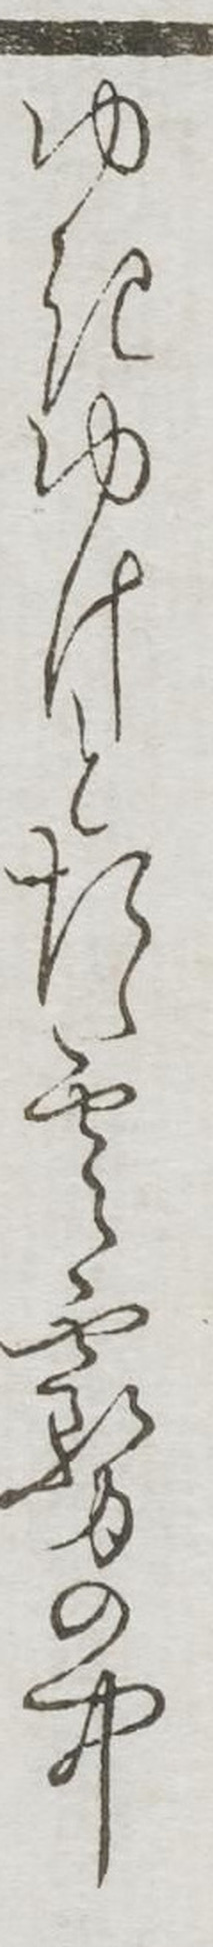ゆきゆけとたゝ雲霧の中
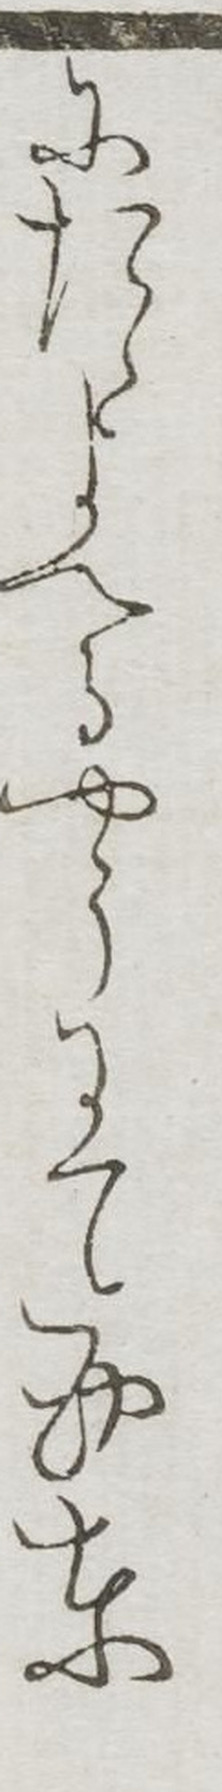にたゝよへるやうにて西東
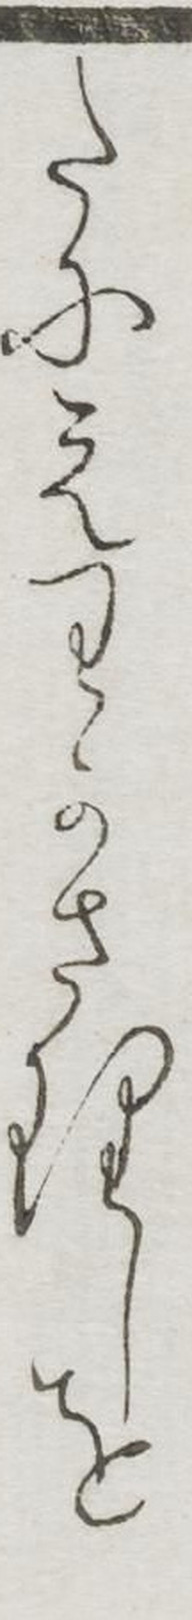たにえわかさりしを
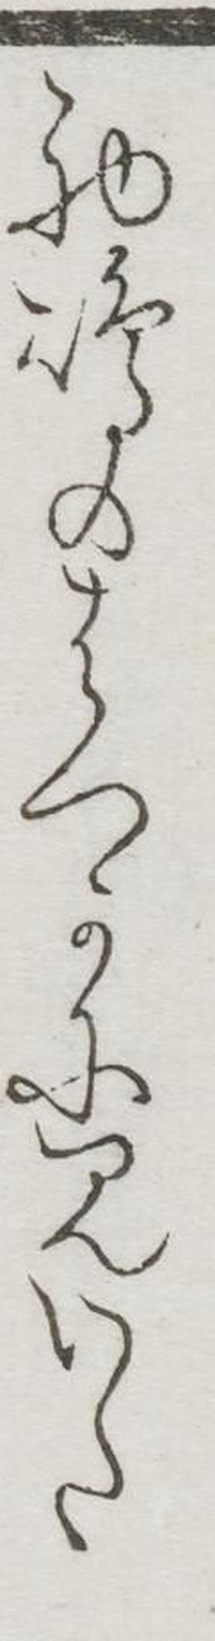初嶋のはつかに見いた
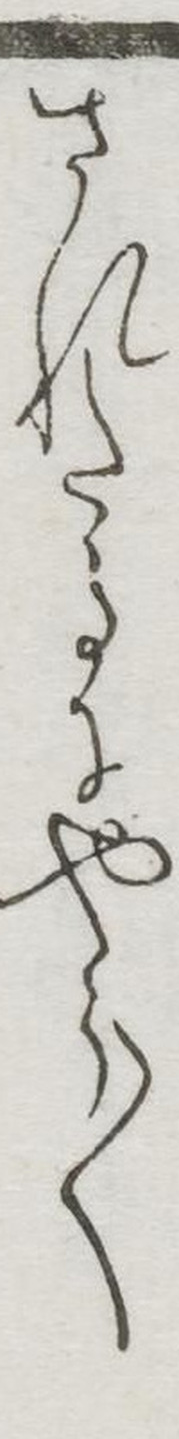されたるにやう〳〵
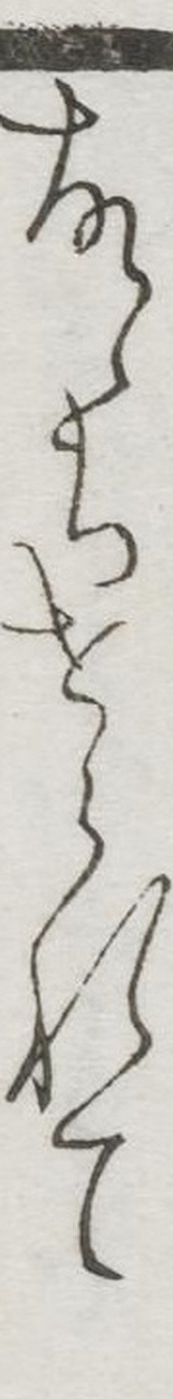こゝちせられて
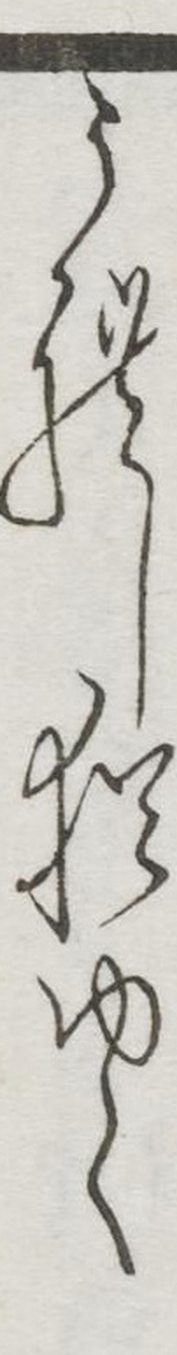うれし猶ゆく
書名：挿画熱海日記　全
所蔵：東京大学地震研究所図書室 Earthquake Research Institute Library, The University of Tokyo, JAPAN
